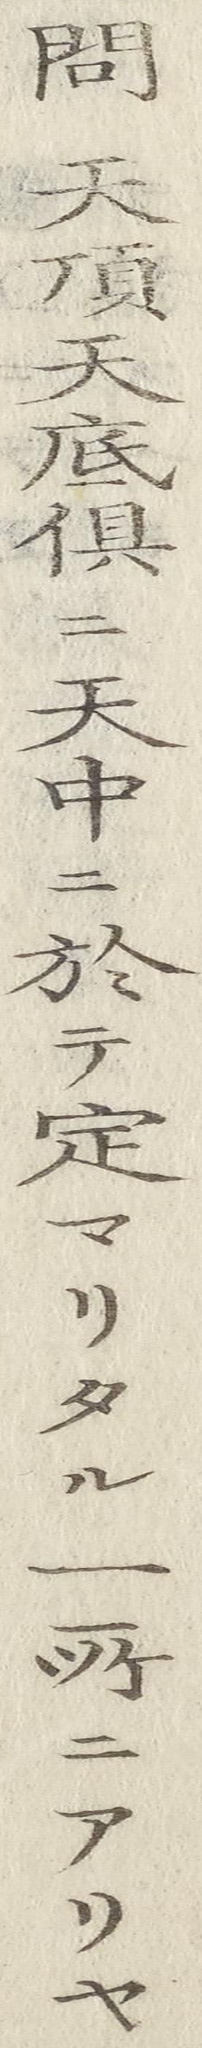問天頂天底倶ニ天中ニ於テ定マリタル一所ニアリヤ
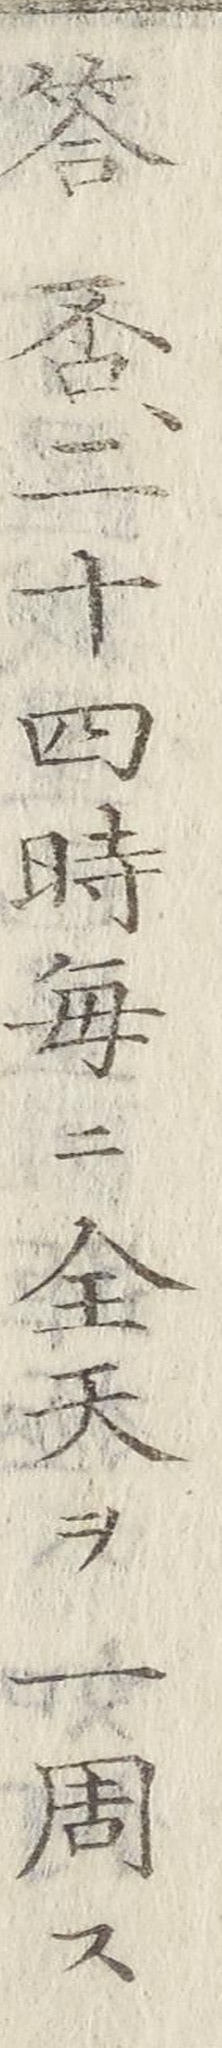答否、二十四時毎ニ全天ヲ一周ス
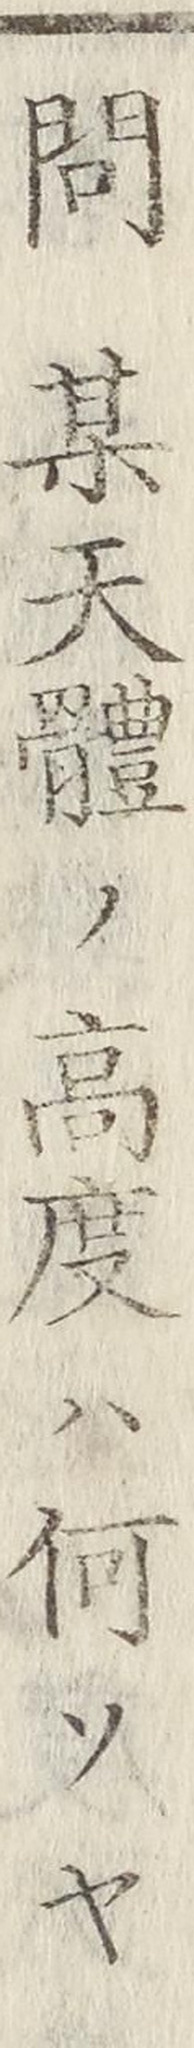問某天体ノ高度ハ何ソヤ
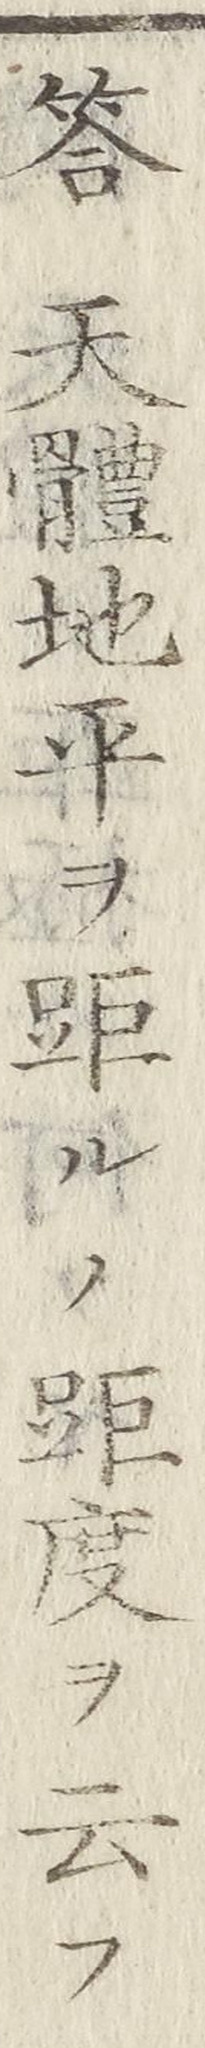答天体地平ヲ距ルノ距度ヲ云フ
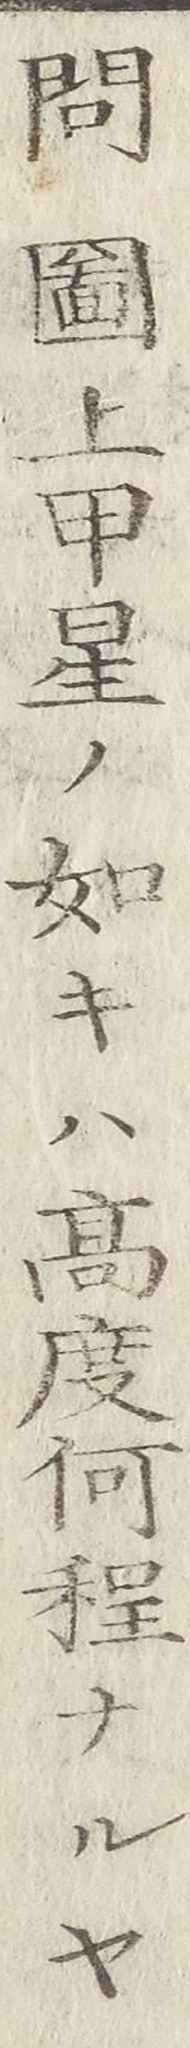問図上甲星ノ如キハ高度何程ナルヤ
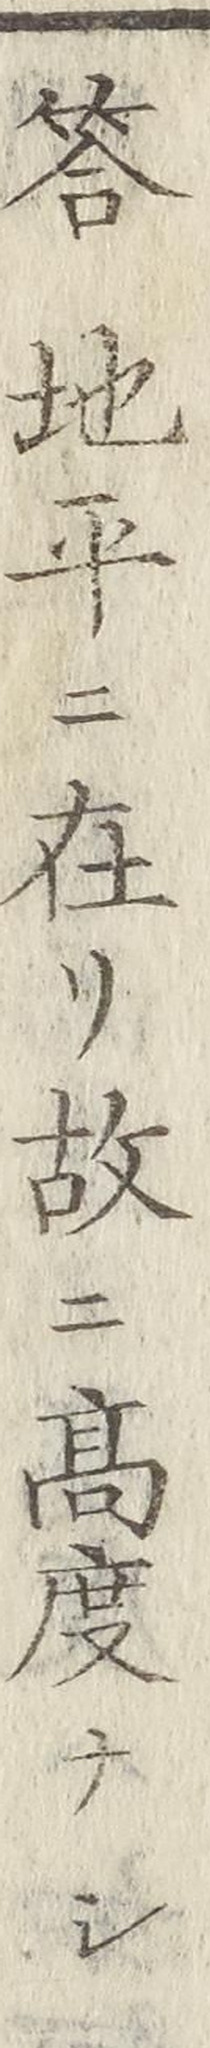答地平ニ在リ故ニ高度ナシ

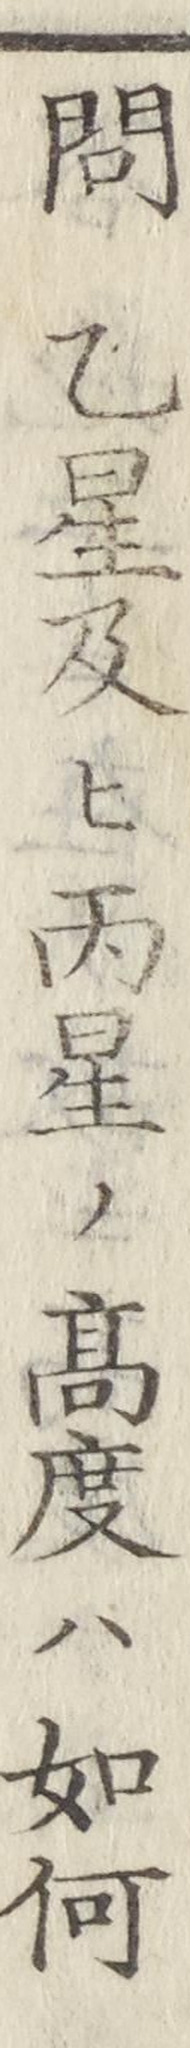問乙星及ヒ丙星ノ高度ハ如何
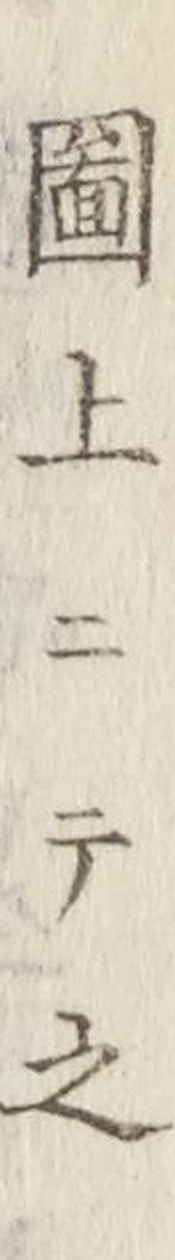図上ニテ之
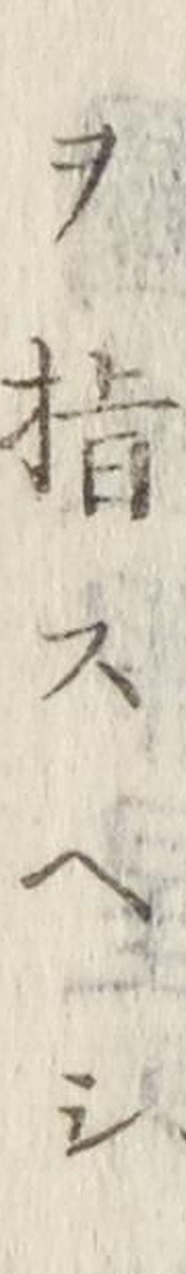ヲ指スヘシ
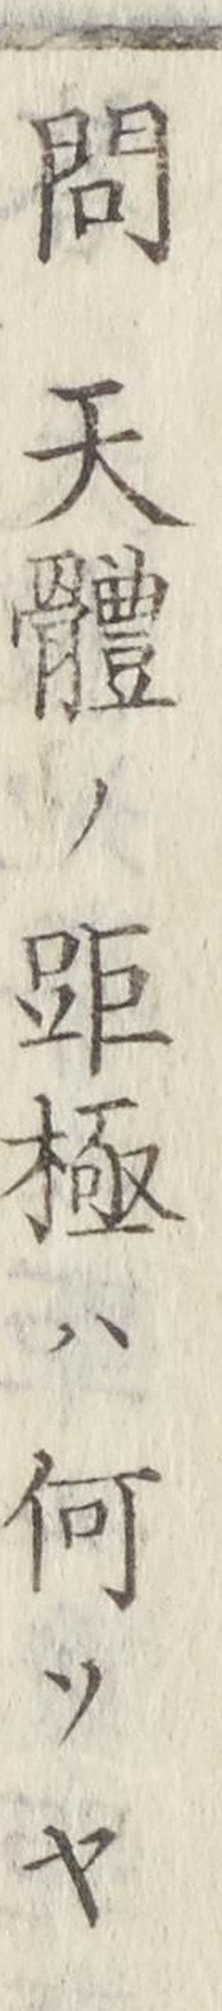問天体ノ距極ハ何ソヤ
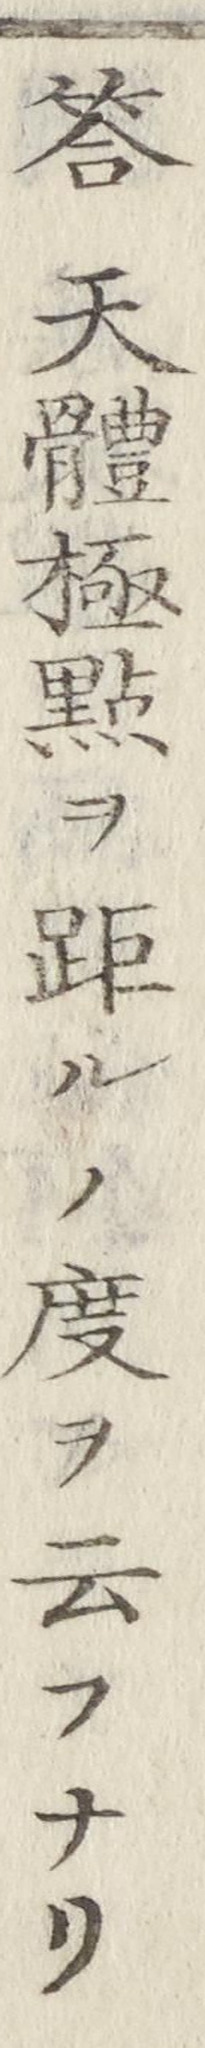答天体極点ヲ距ルノ度ヲ云フナリ
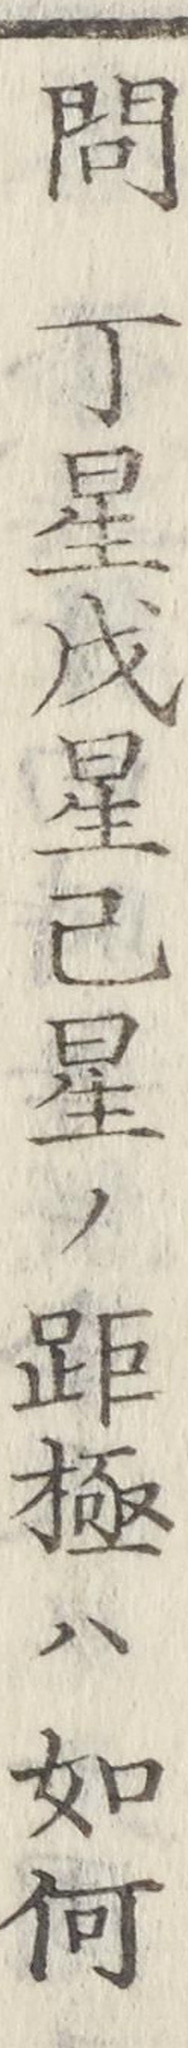問丁星戊星己星ノ距極ハ如何
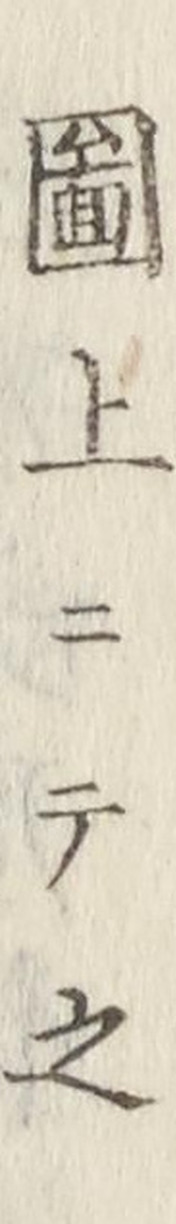図上ニテ之
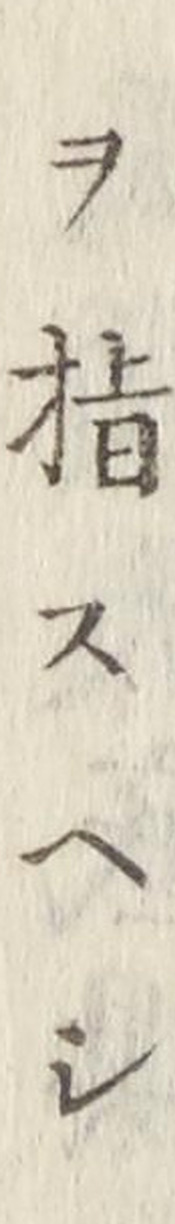ヲ指スヘシ
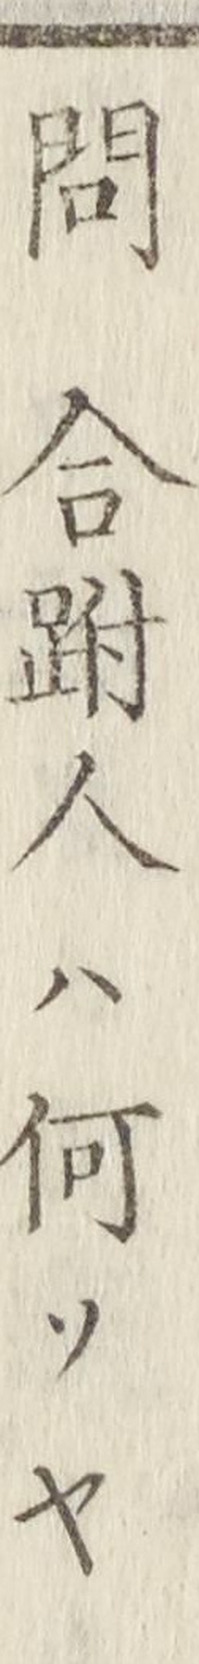問合跗人ハ何ソヤ
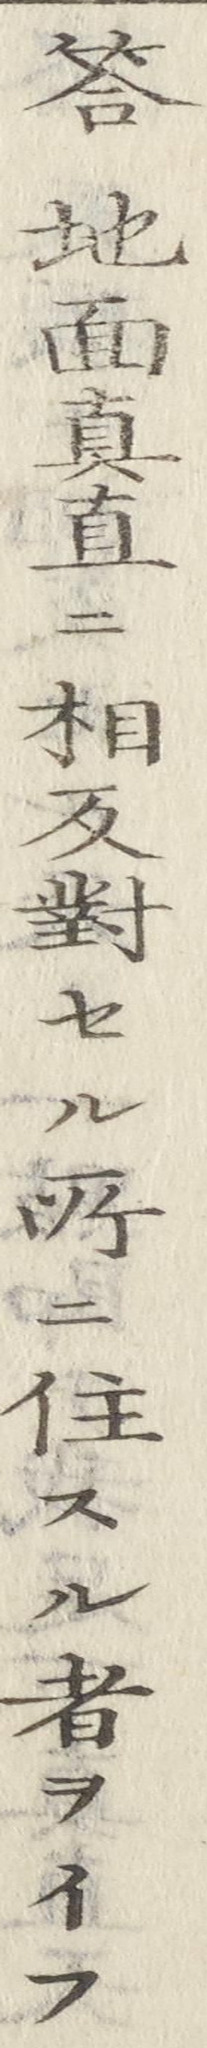答地面真直ニ相反対セル所ニ住スル者ヲイフ
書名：星学圖説　上
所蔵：東京大学地震研究所図書室 Earthquake Research Institute Library, The University of Tokyo, JAPAN
